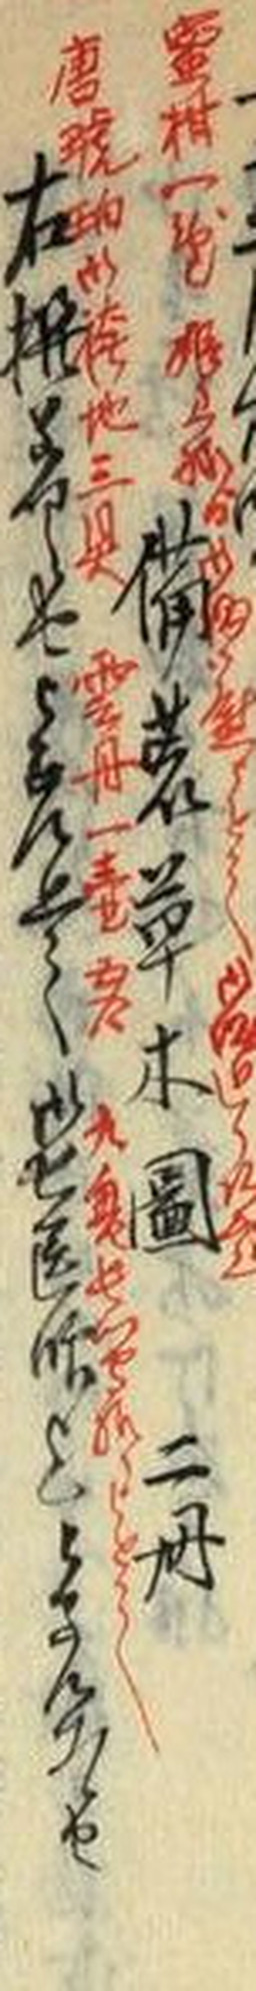右撰着之由被差上之御匙医師迄被差出候由
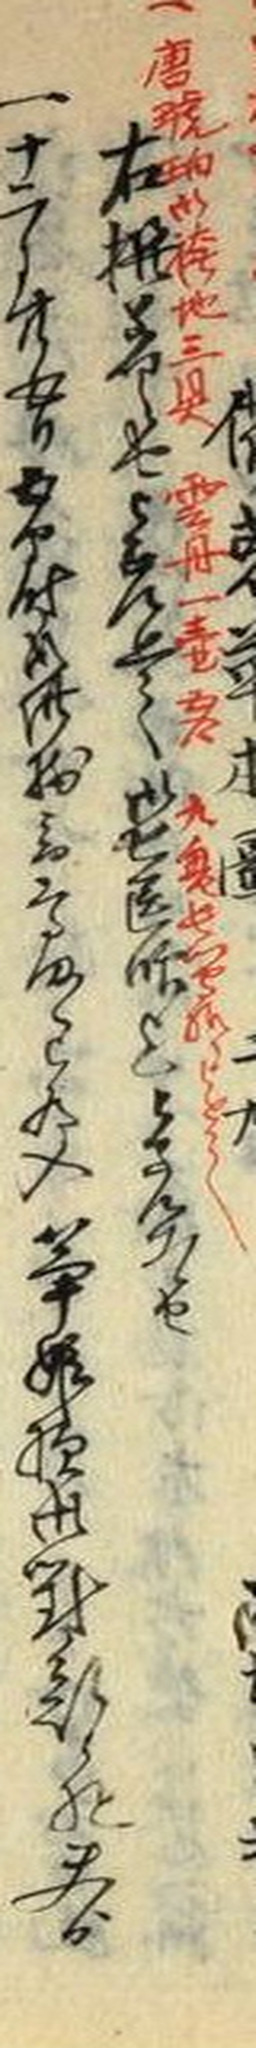一十二月廿五日五半時御供揃ニ而高田へ被為入箏姫様御対顔被遊夫ゟ
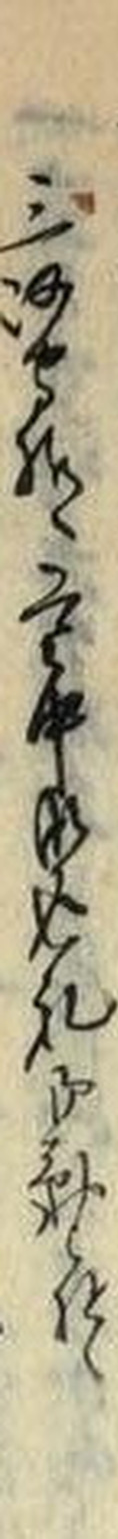三河守様へ寒中御返礼御勤被遊候
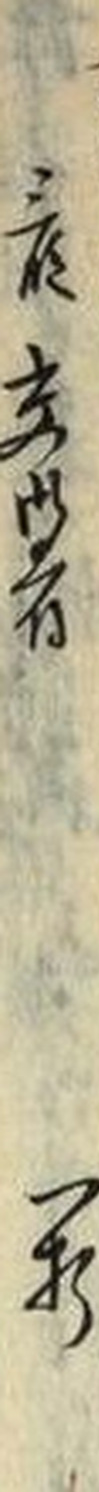三段交御肴一折
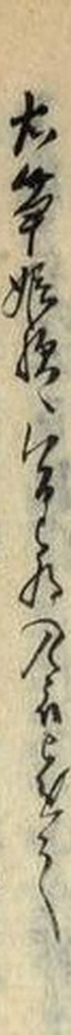右箏姫様へ今日被為入候ニ付被進之
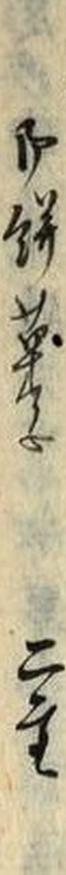御餅菓子二重
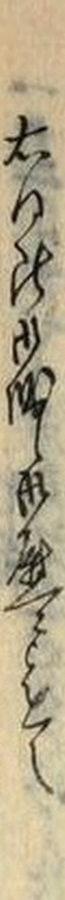右同断御側御慰ニ被進之
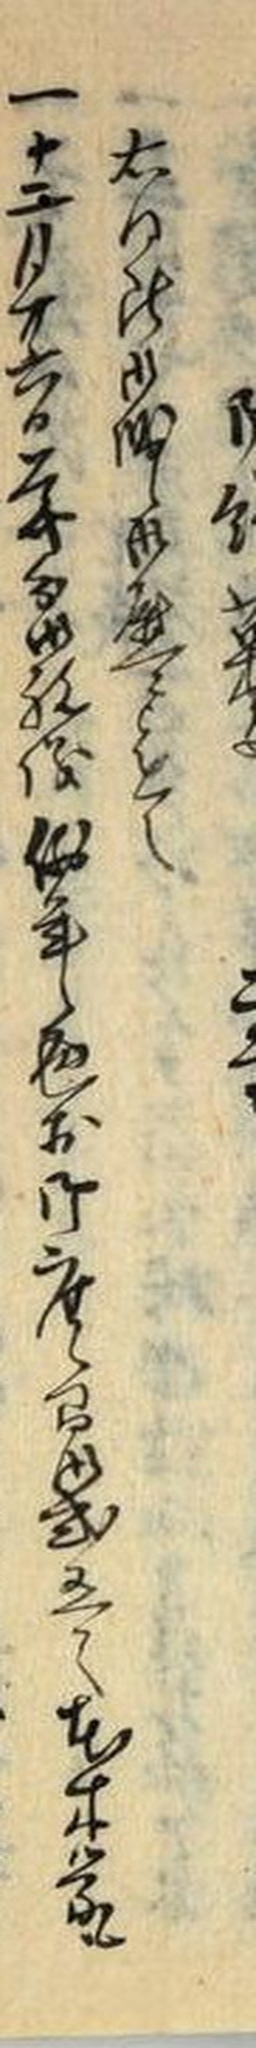一十二月廿六日節分御祝儀例年之通於御座之間御式有之花木栄も
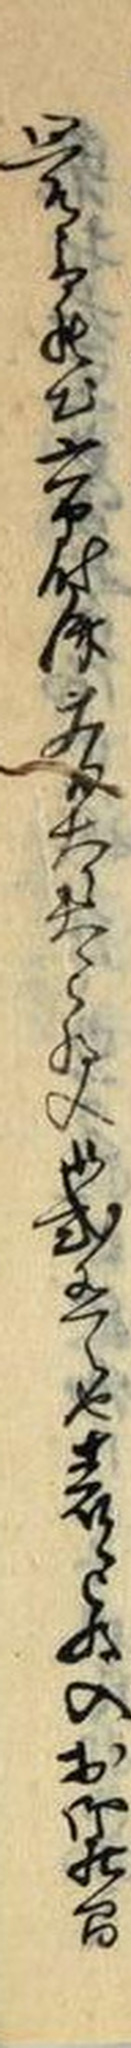思召ニ而罷出六半時済夫ゟ大奥へ被為入御式有之候由表へ被為入於御居間

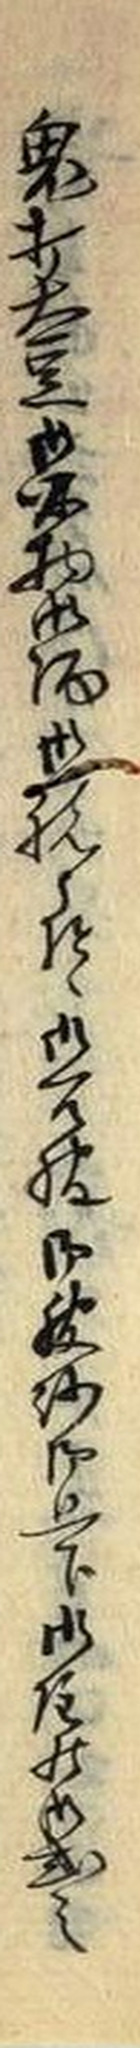鬼打大豆御吸物御酒御祝被遊候御召服御服紗御上下御住居御式之
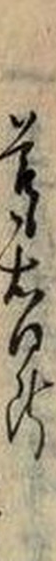節も右同断
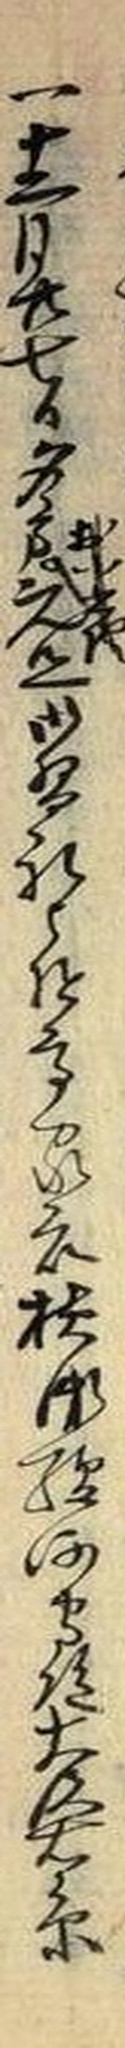一十二月廿七日夕方元旦御習礼被遊高家衆横瀬駿河守殿大沢右京
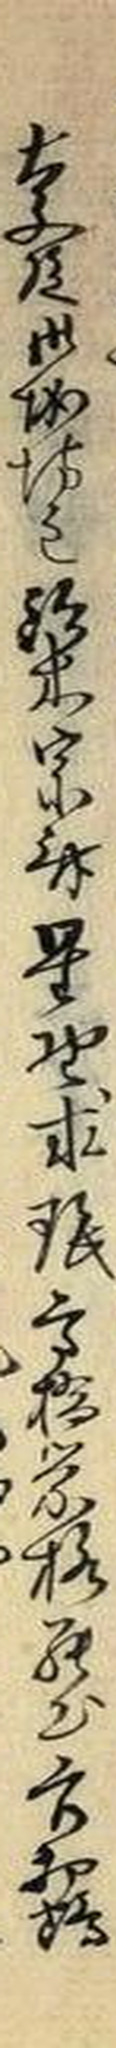太夫殿御城坊主鈴木宗斉星野求珉高橋栄格罷出最初鶴
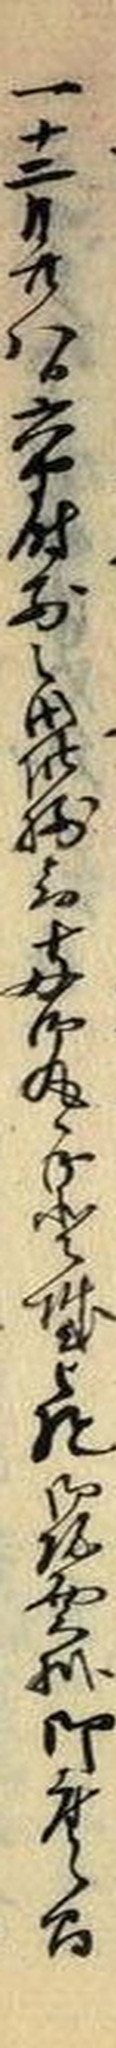一十二月廿八日六半時前之御供揃ニ而両御丸へ御登城被遊御帰殿掛御座之間
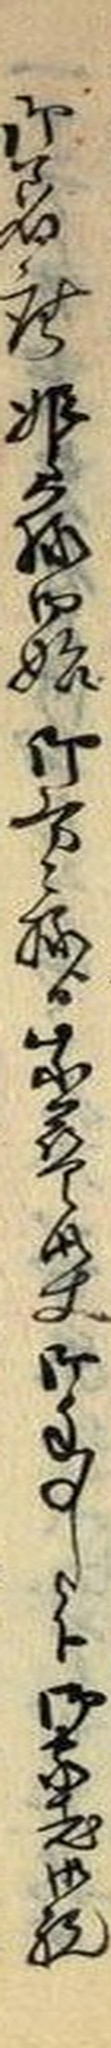御着座姫君様御始御方々様ゟ歳暮之御使御手のし被下御家老御祝
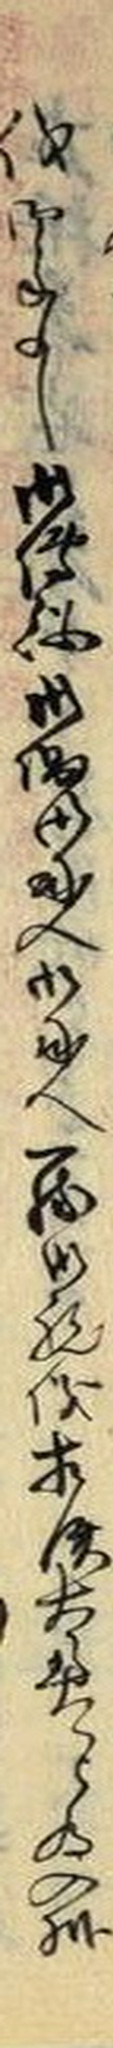儀御手のし御傅役御側御用人御用人一統御祝儀相済大奥へ被為入掛
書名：少傅日録抄（斉承付側向頭取日記、在府）
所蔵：福井県文書館 Fukui Prefectural Archives
